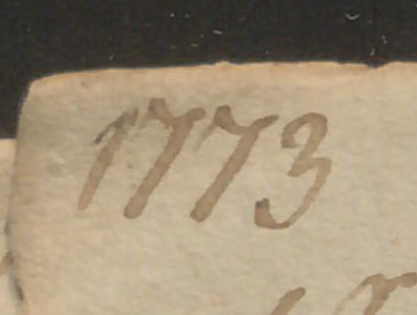1773
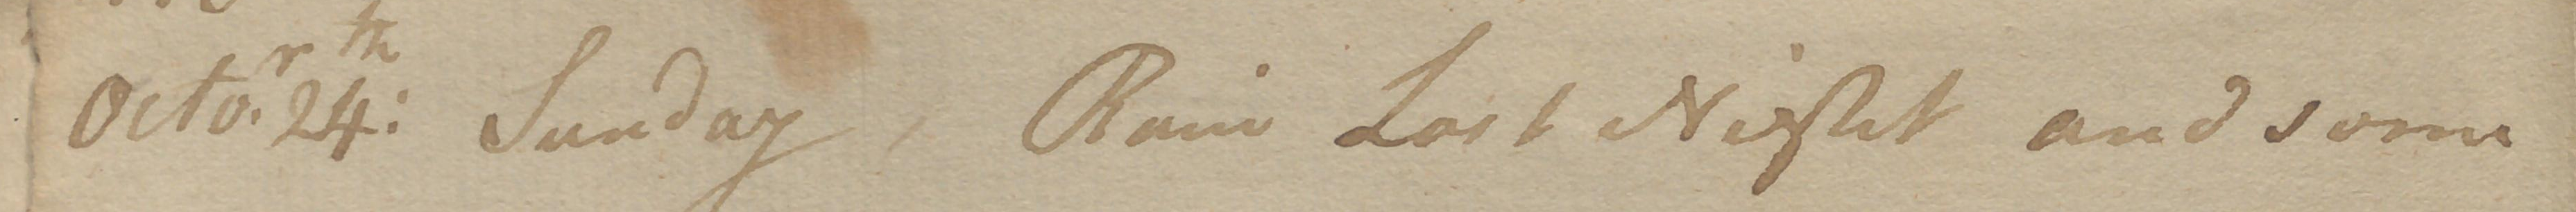Octo^r. 24^th. Sunday Rain Last Night and some
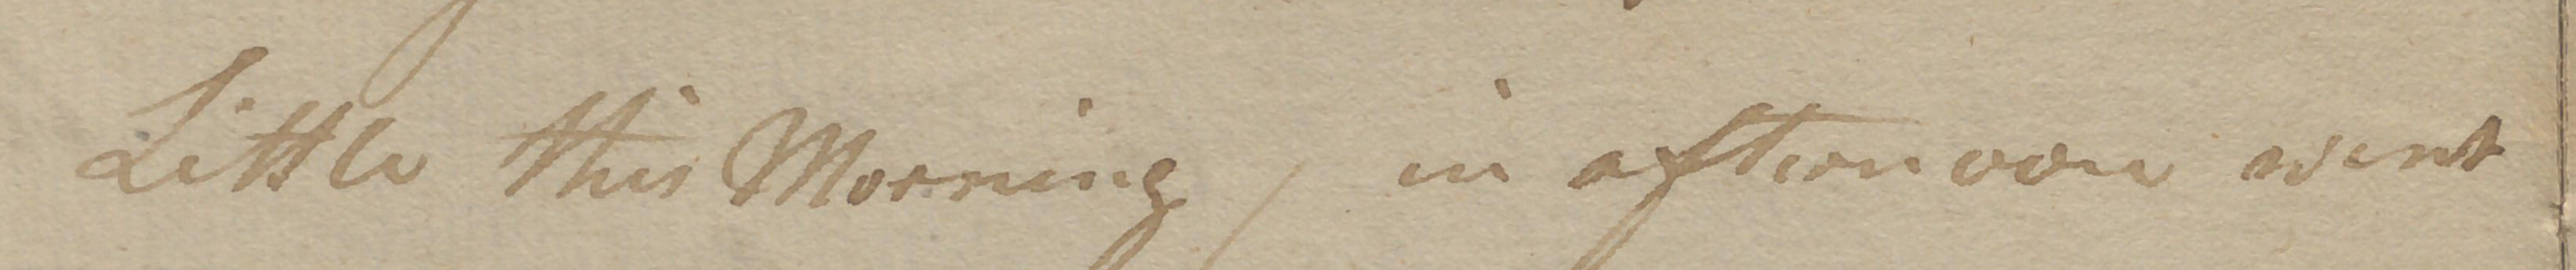Little this Morning, in afternoon went
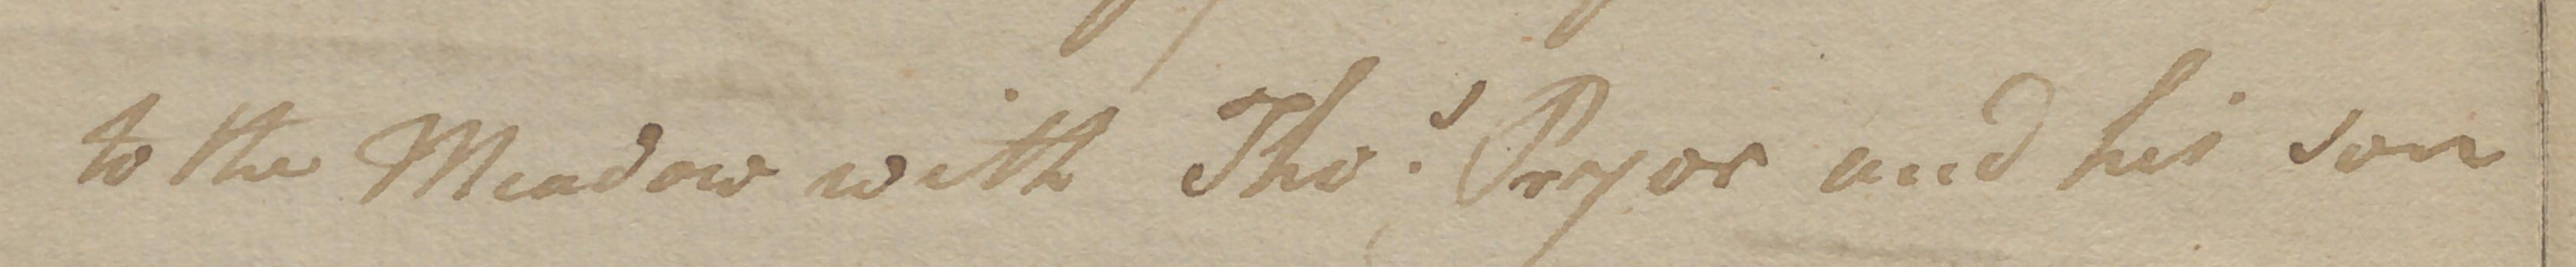to the Meadow with Tho^s. Pryor and his son
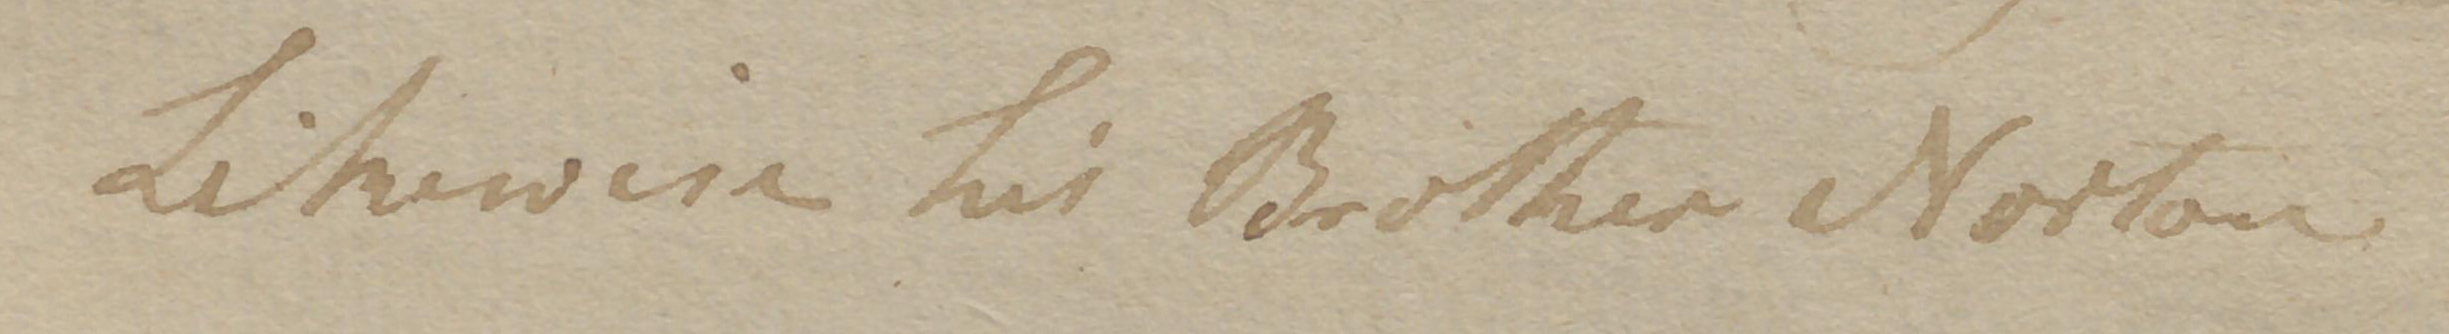Likewise his Brother Norton
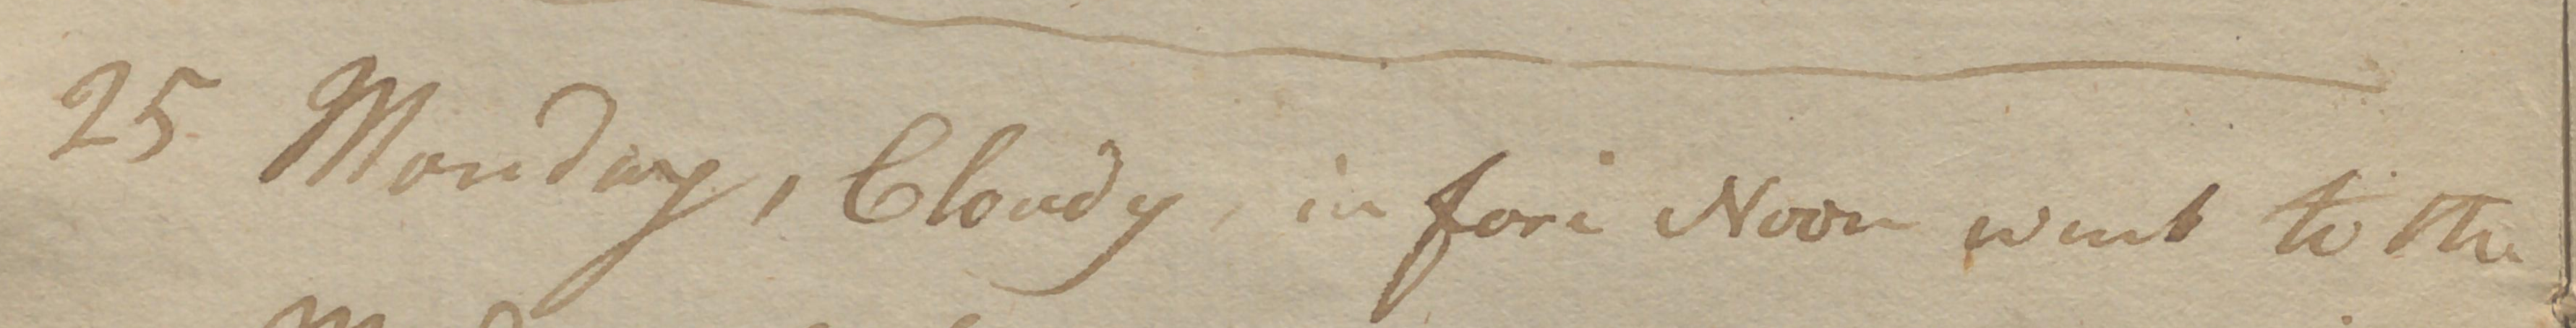25 Monday, Cloudy in fore Noon went to the
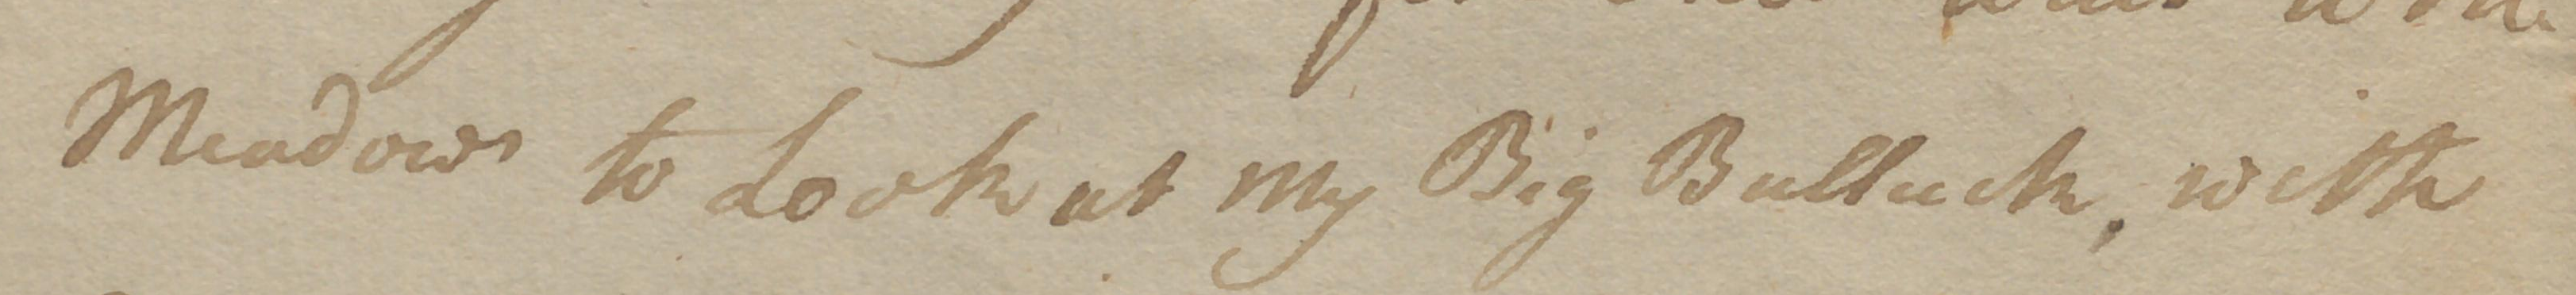Meadow to Look at my Big Bulluck with
